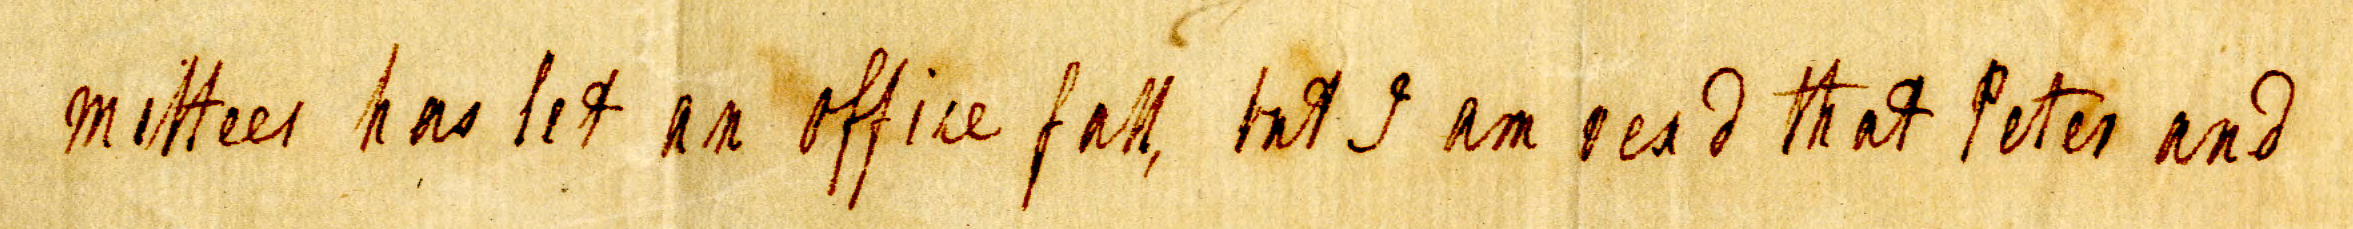mittees has let an office fall, but I am resd that Peter and
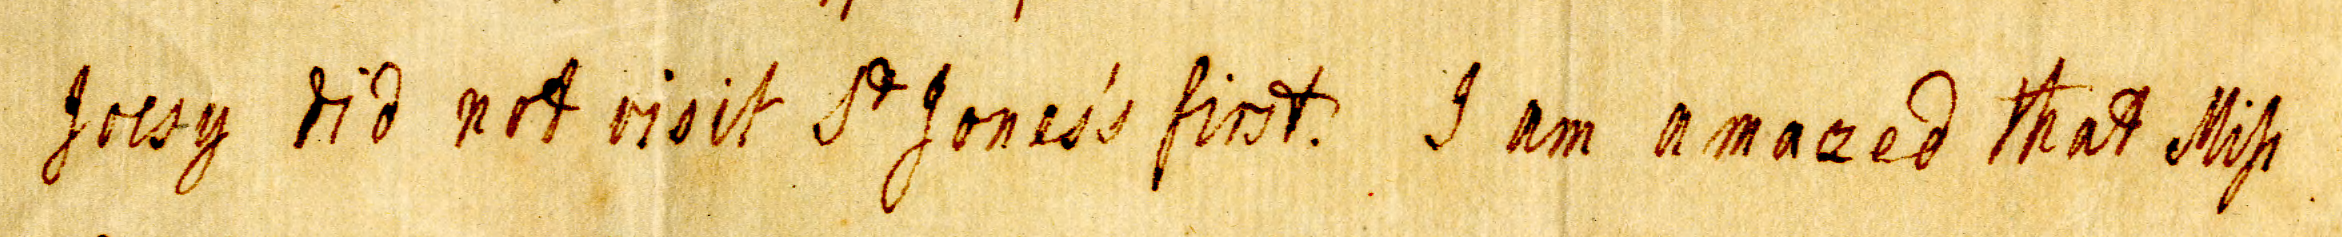Joesy did not visit S^t Jones's first. I am amazed that Miss
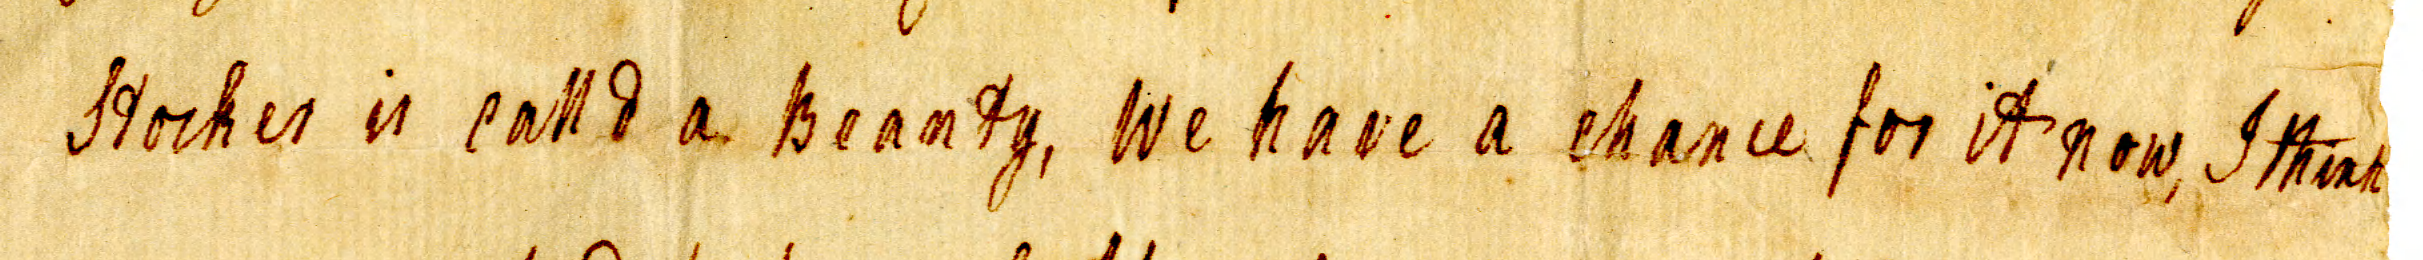Hocker is calld a Beauty, we have a chance for it now, I think
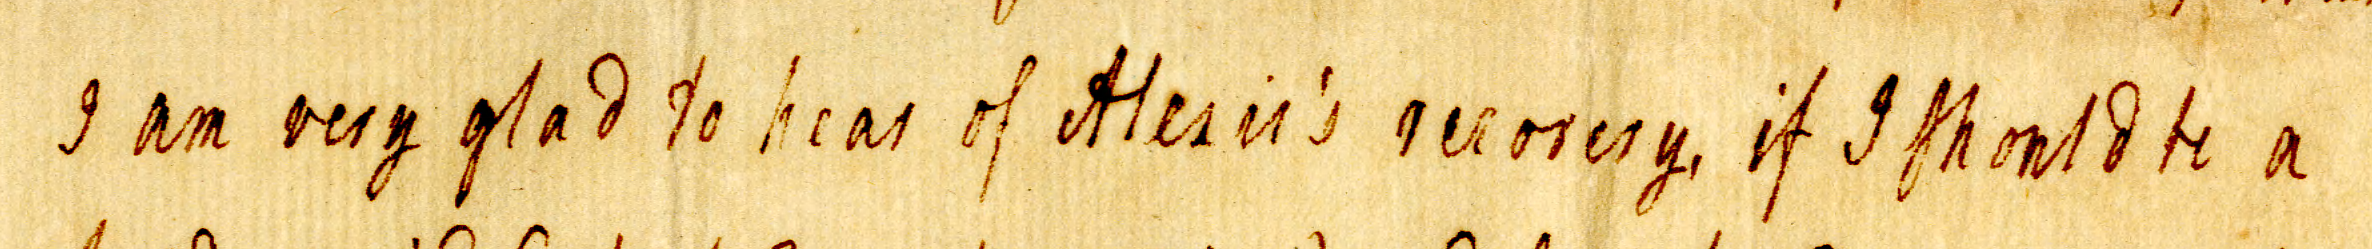I am very glad to hear of Alexis's recovery, if I should be a
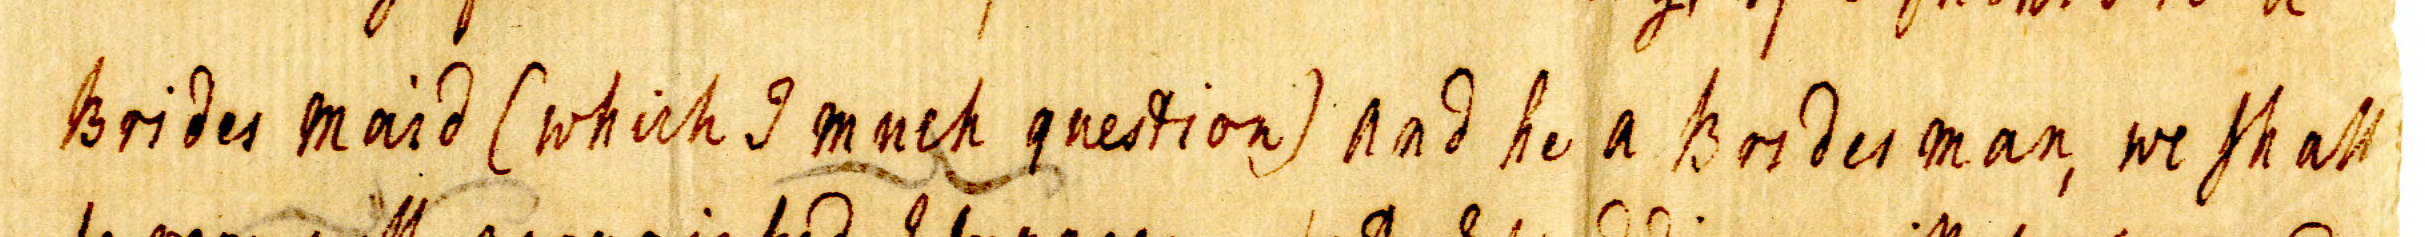Brides Maid (which I much question) and he a Bridesman, we shall
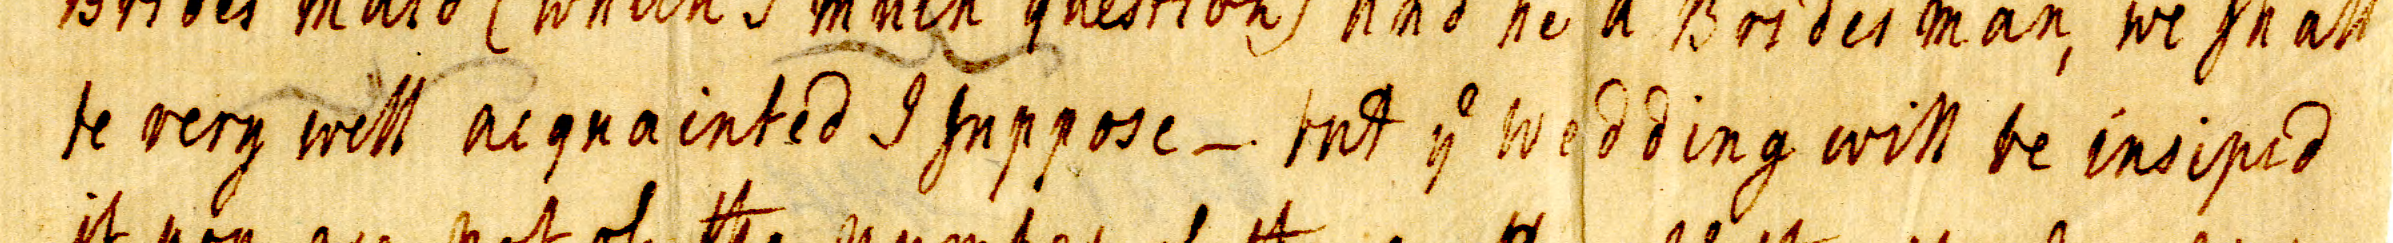be very well acquainted I suppose-. but y^e wedding will be insipid
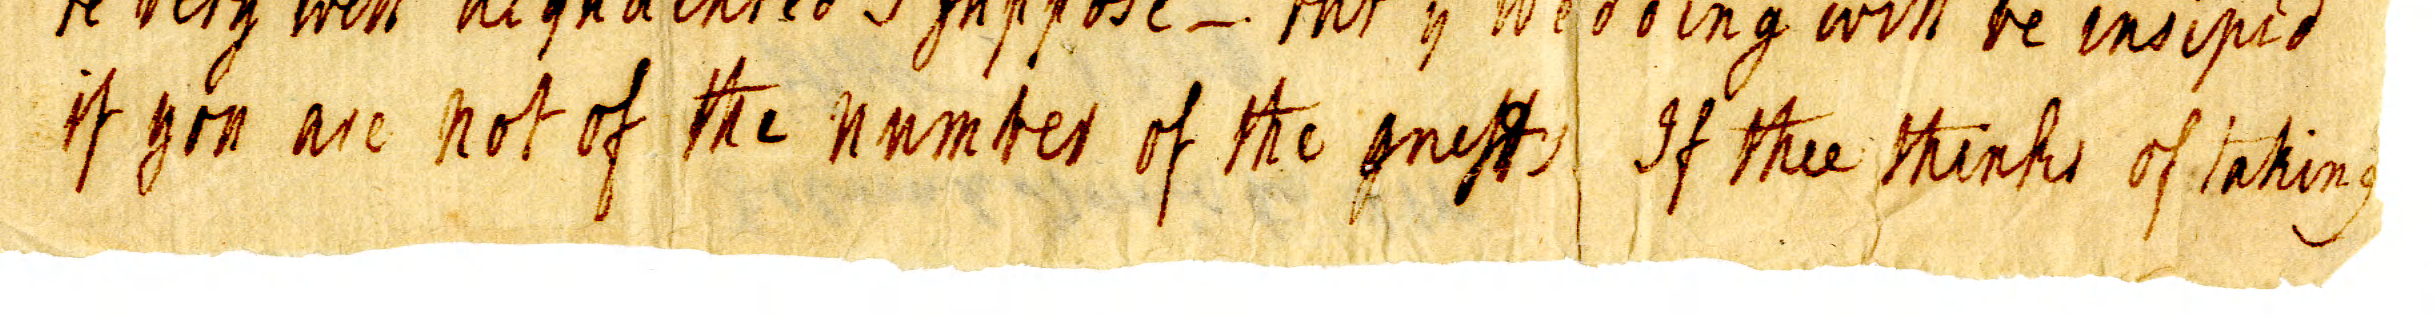if you are not of the number of the guest If thee thinks of taking
